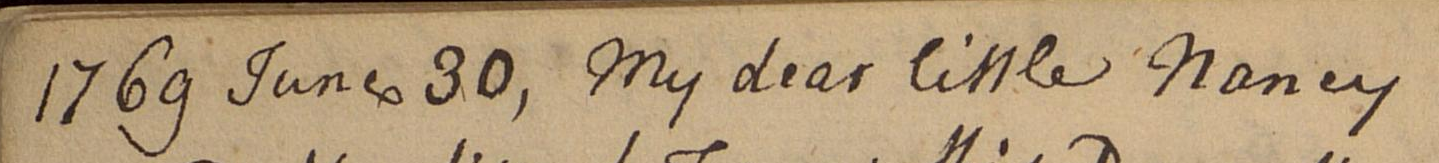1769 June 30, My dear little Nancy
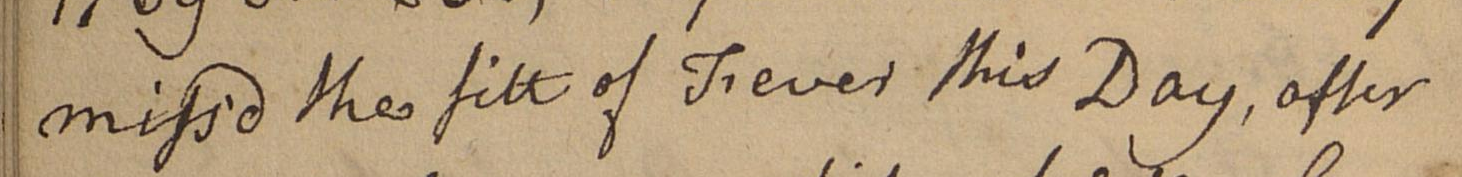miss'd the fitt of Fever this Day, after
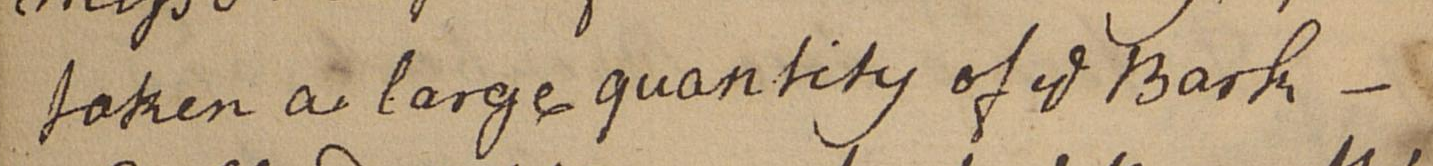taken a large quantity of y^e Bark-
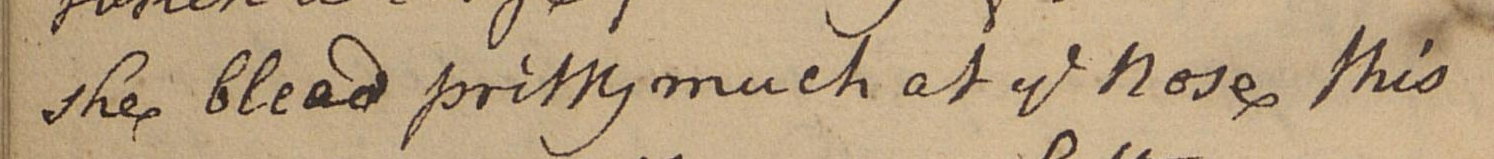she blead pritty much at y^e Nose this
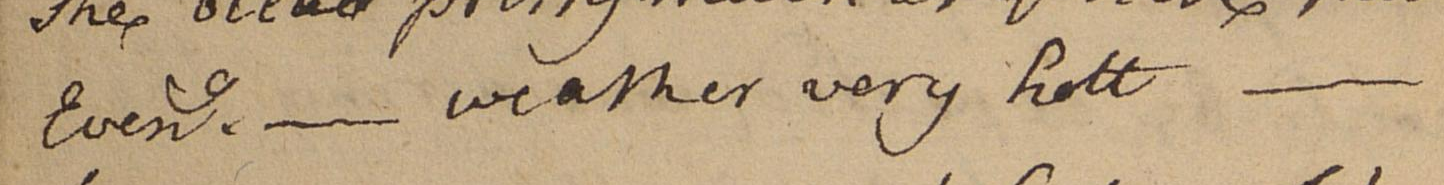Even^g.- weather very hott-
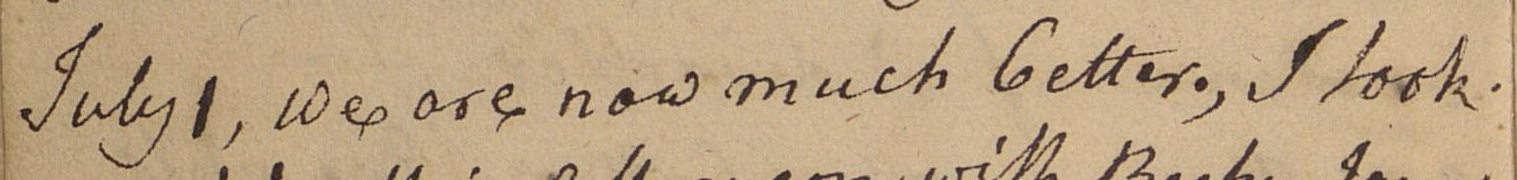July 1, we are now much better, I took
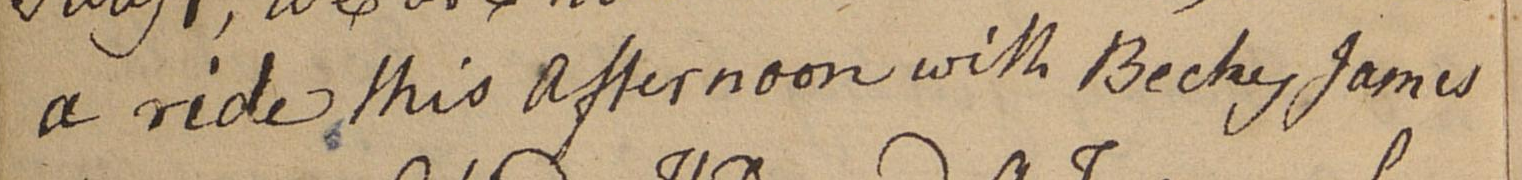a ride this Afternoon with Becky James
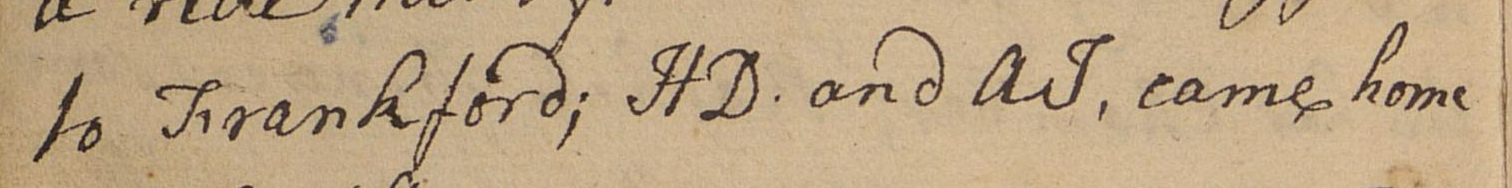to Frankford; HD. and A J. came home
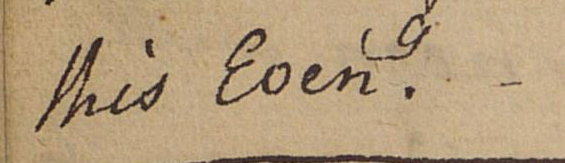this Even^g -
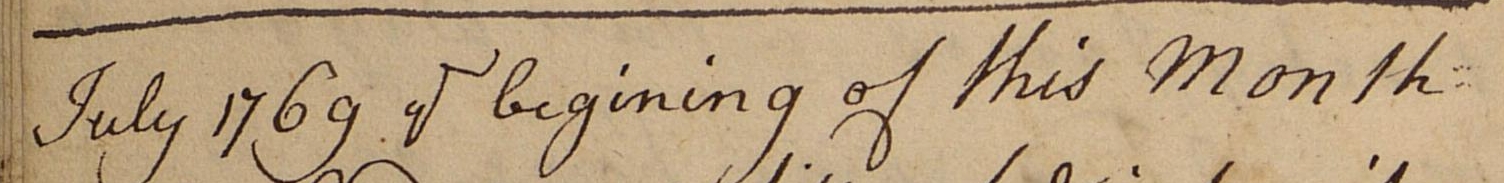July 1769 y^e begining of this Month
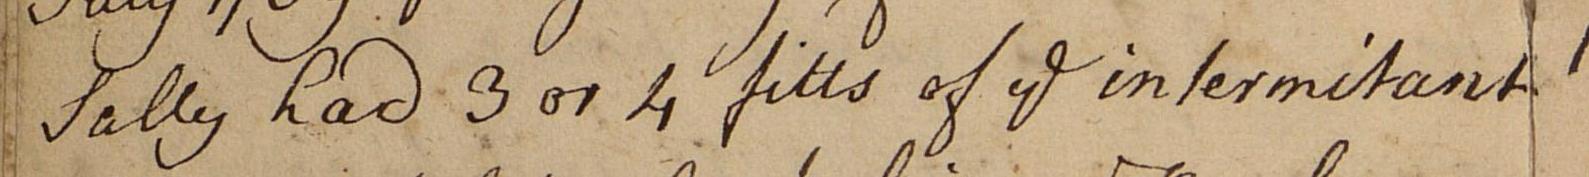Sally had 3 or 4 fitts of y^e intermitant
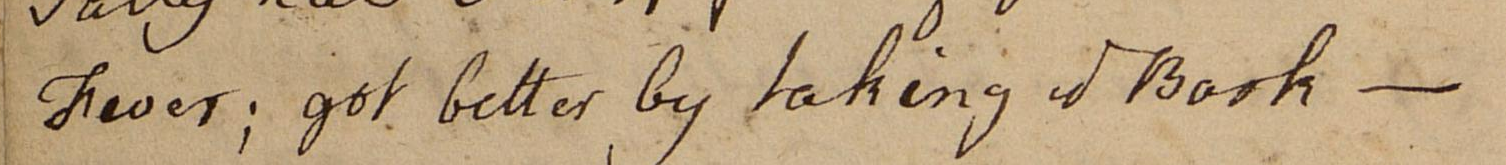Fever; got better by taking y^e Bark-
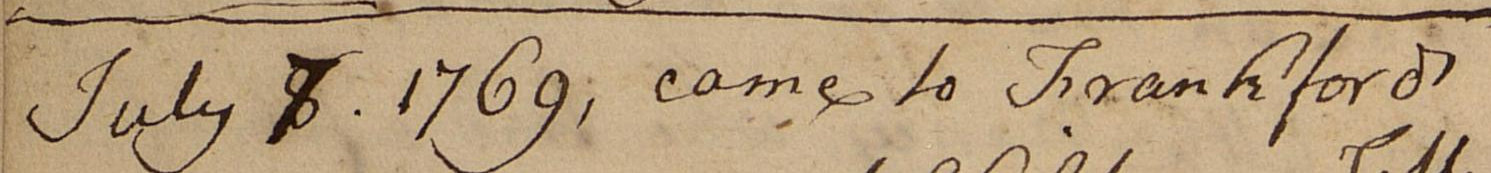July 7. 1769, came to Frankford
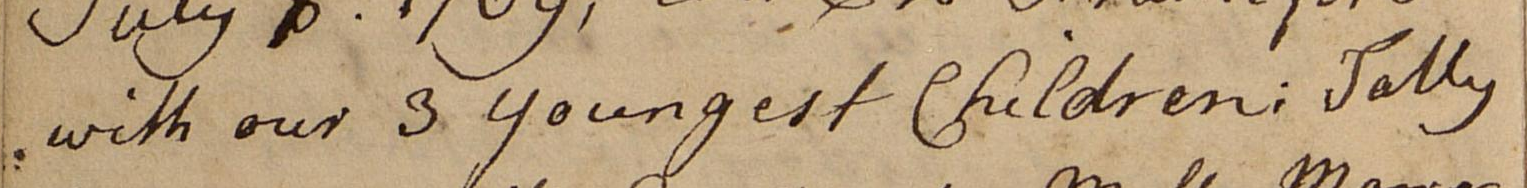with our 3 youngest Children: Sally
